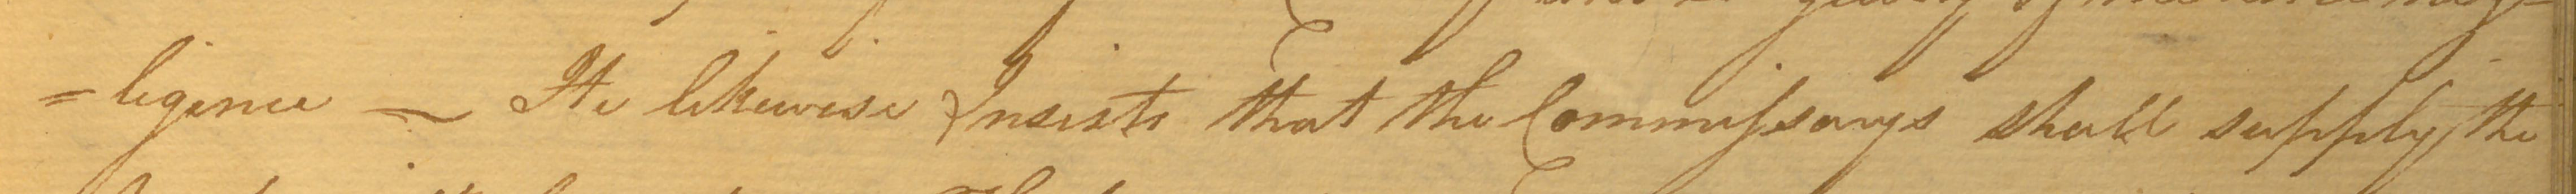-ligence- He likewise Insists that the Commissarys shall supply the
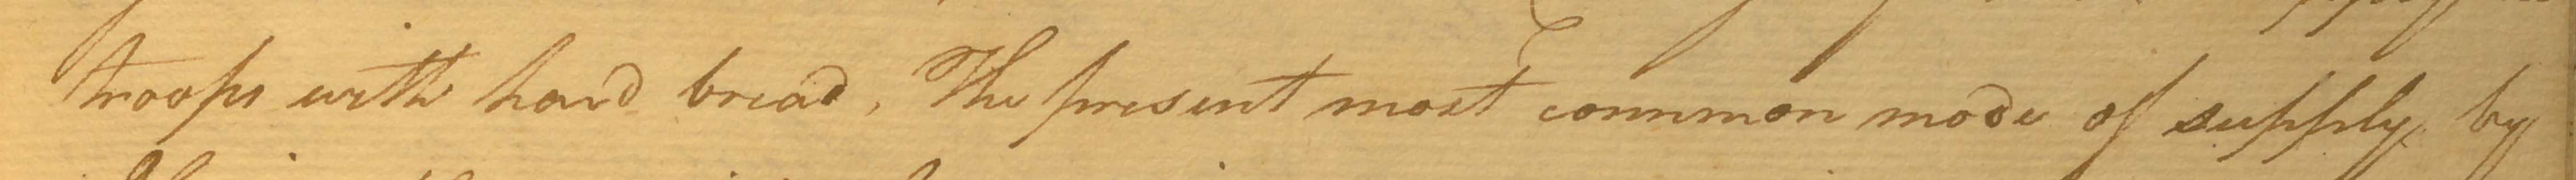troops with hard bread. The present most common mode of supply by
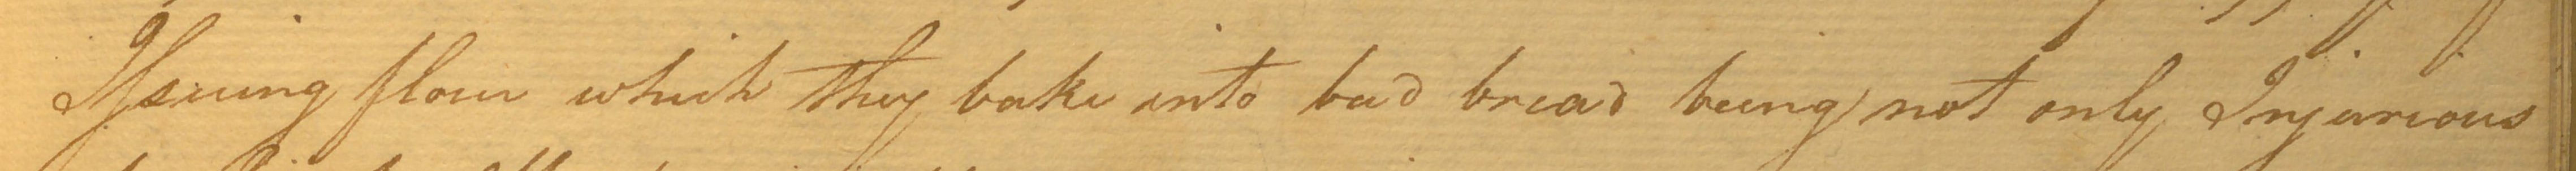Issuing flour which they bake into bad bread being not only Injurious
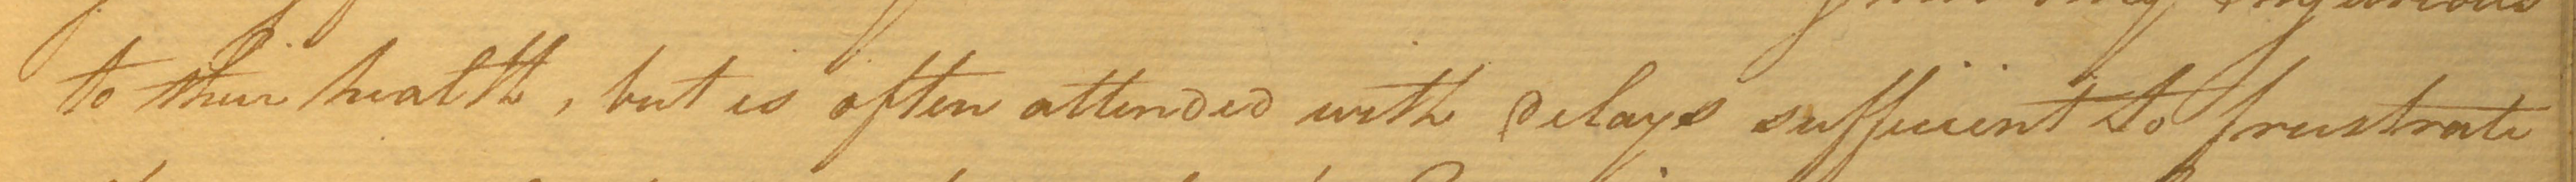to their health, but is often attended with delays sufficient to frustrate
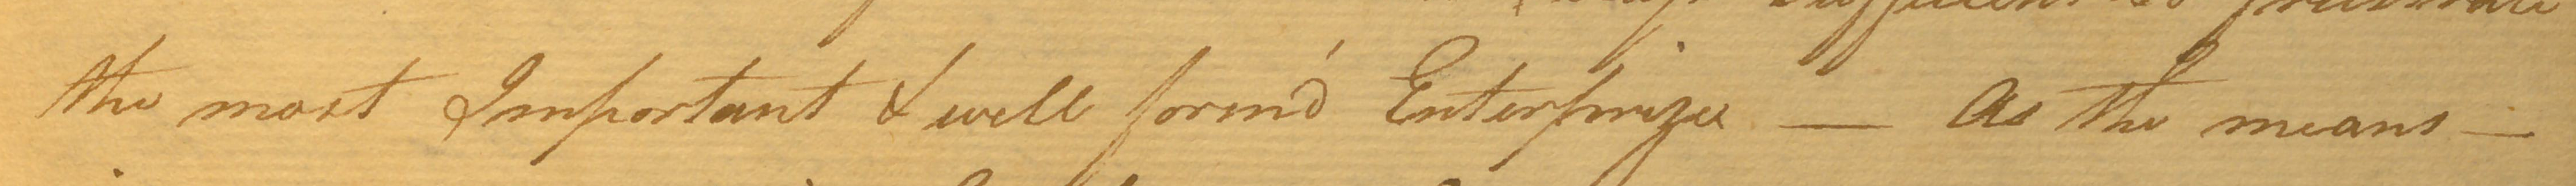the most Important & well form'd Enterprizes.- As the means-
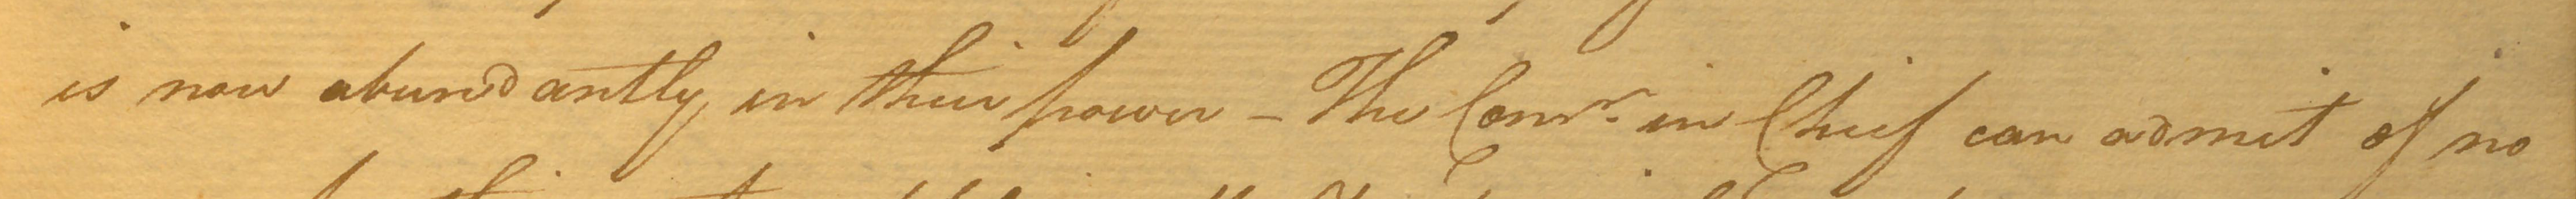is now abundantly in their power- The Com^r. in Chief can admit of no
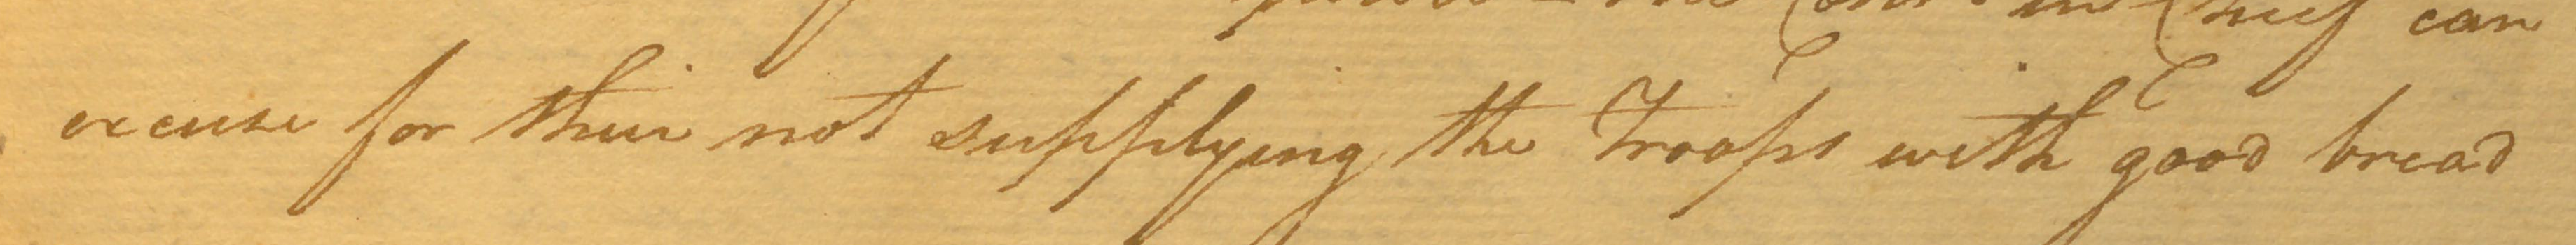excuse for their not supplying the Troops with good bread
